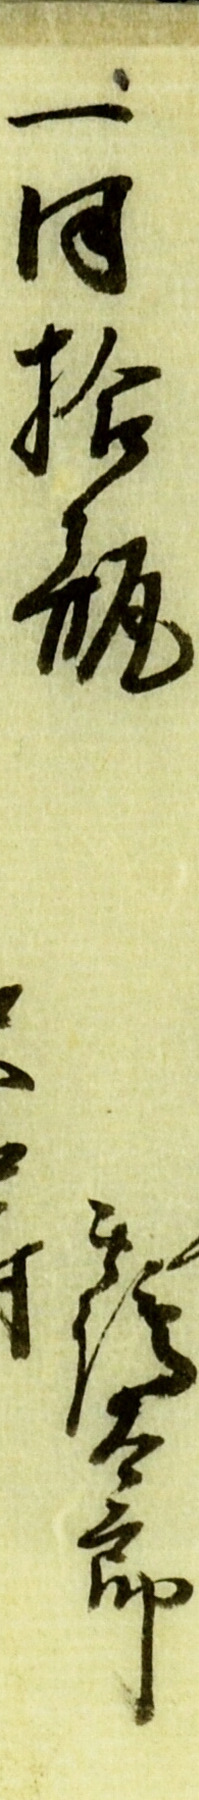一同拾瓶鶴太郎
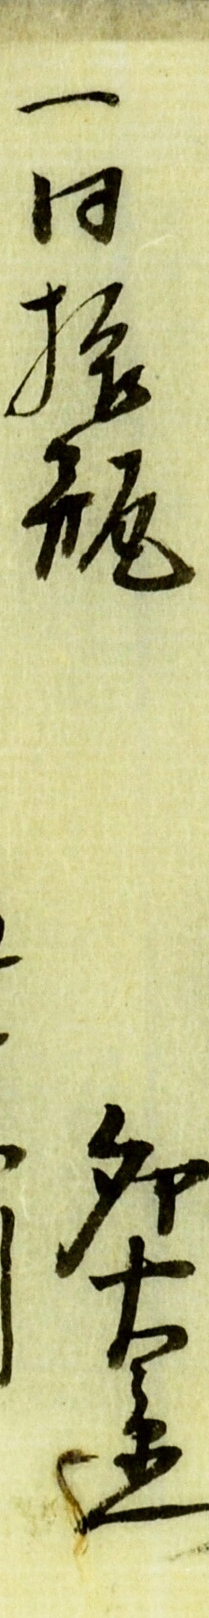一同拾瓶卯右衛門
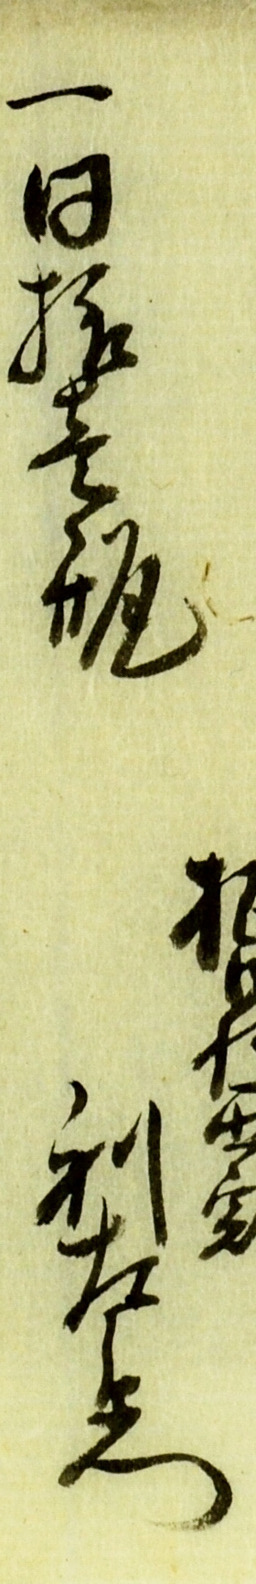一同拾壱瓶利左衛門
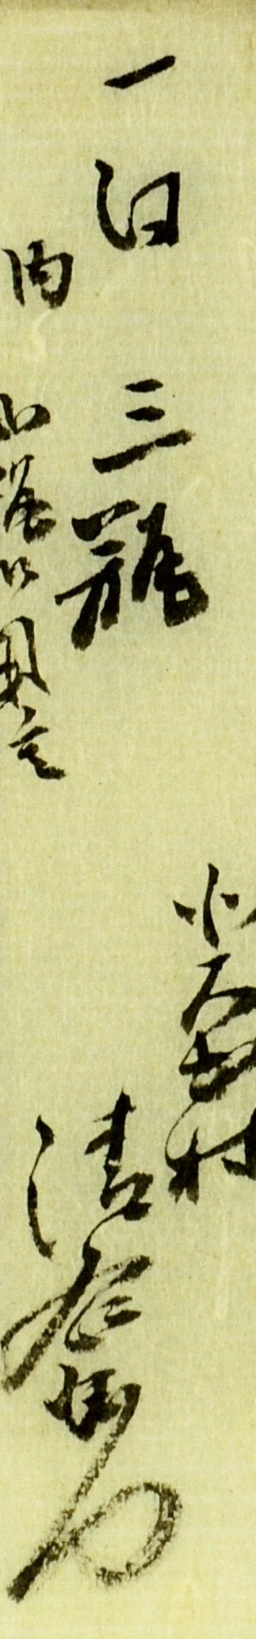一同三瓶清右衛門
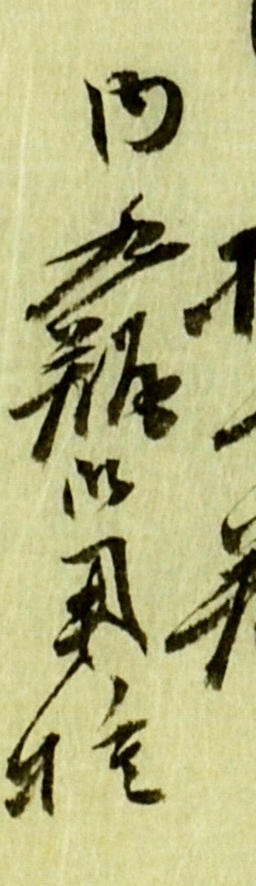内九瓶御用捨
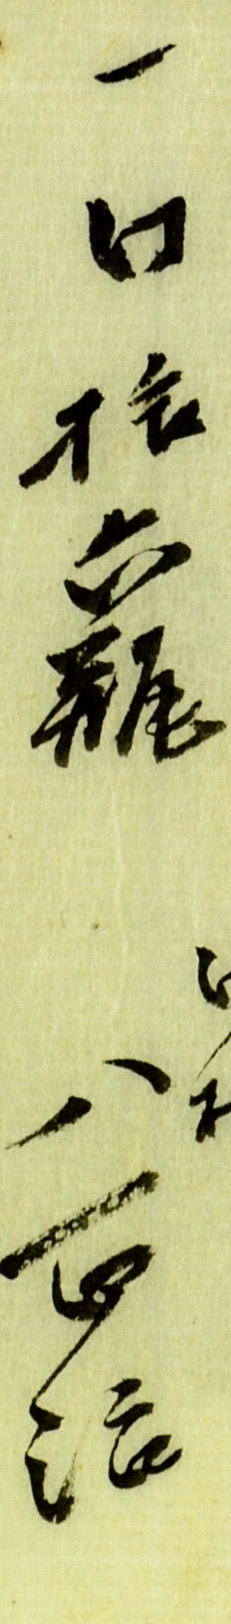一同拾六瓶八百治
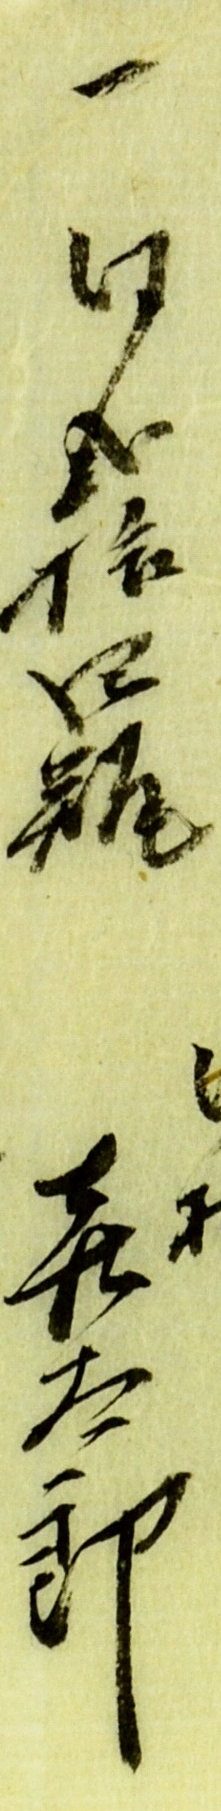一同弐拾四瓶喜太郎
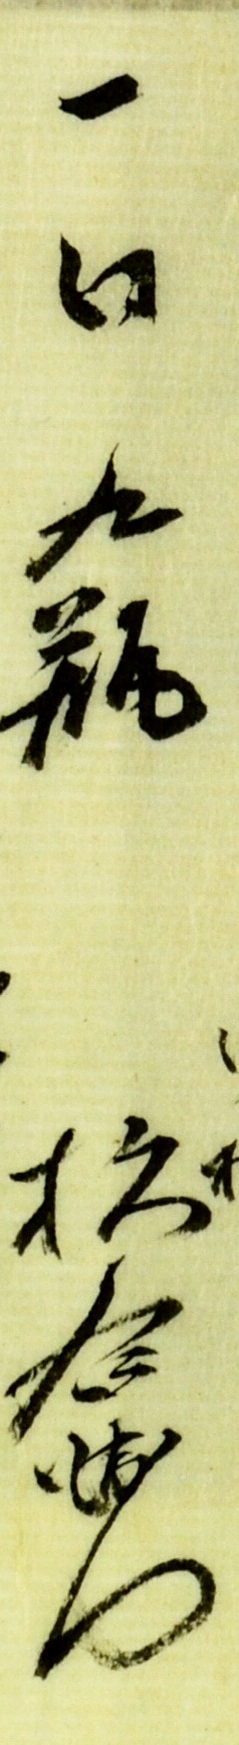一同九瓶杉右衛門
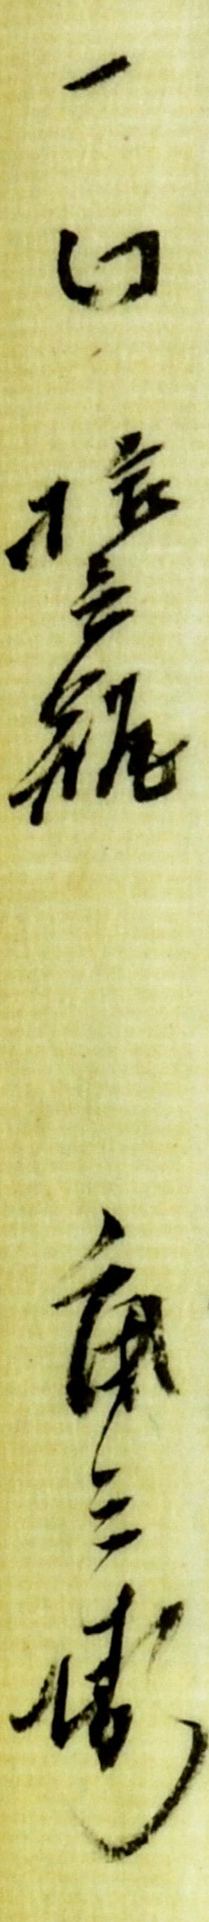一同拾壱瓶利左衛門
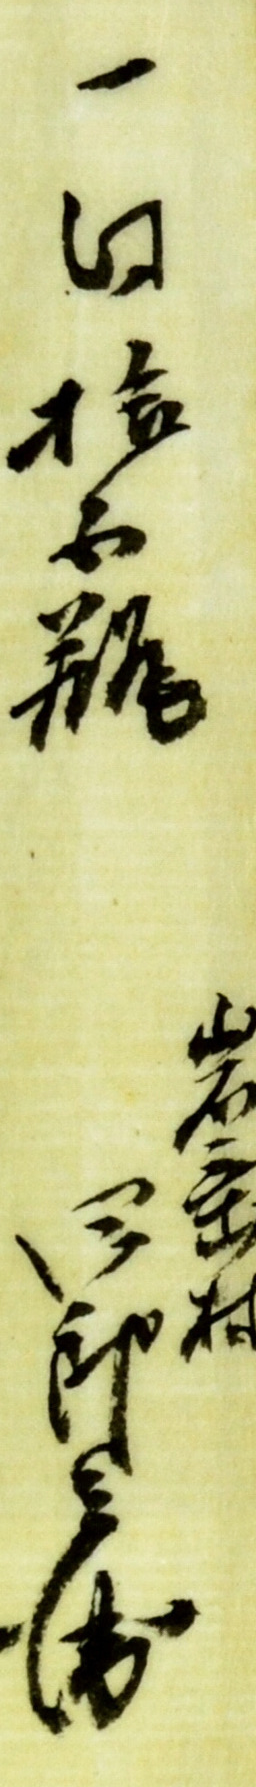一同拾三瓶角兵衛

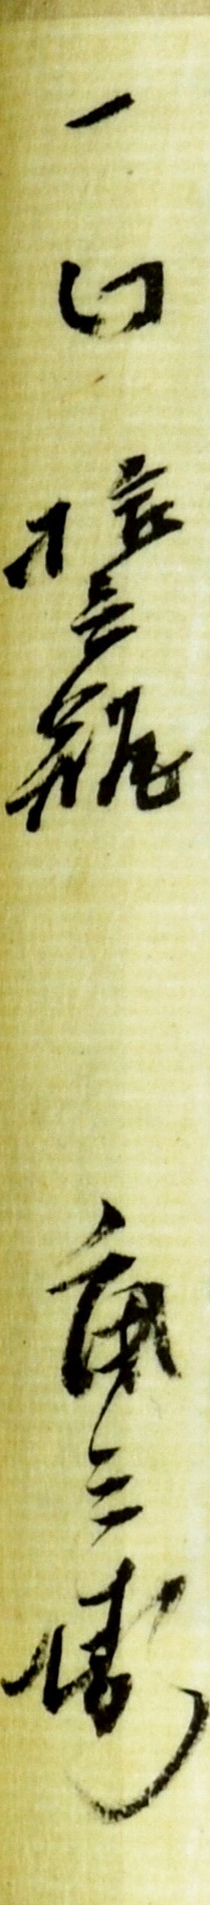一同拾五瓶四郎兵衛
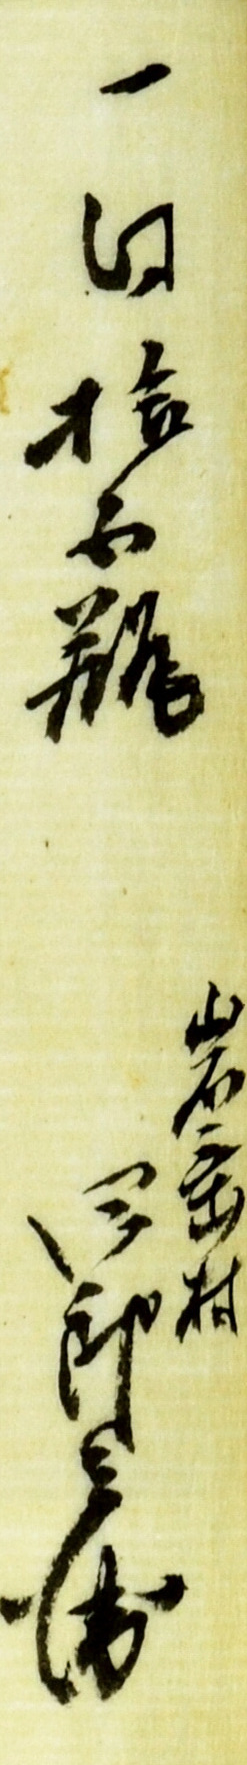一同拾五瓶四郎兵衛
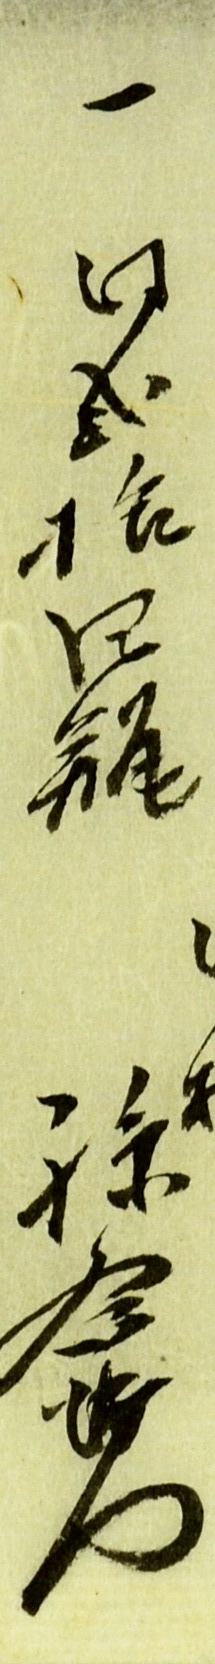一同弐拾四瓶弥右衛門
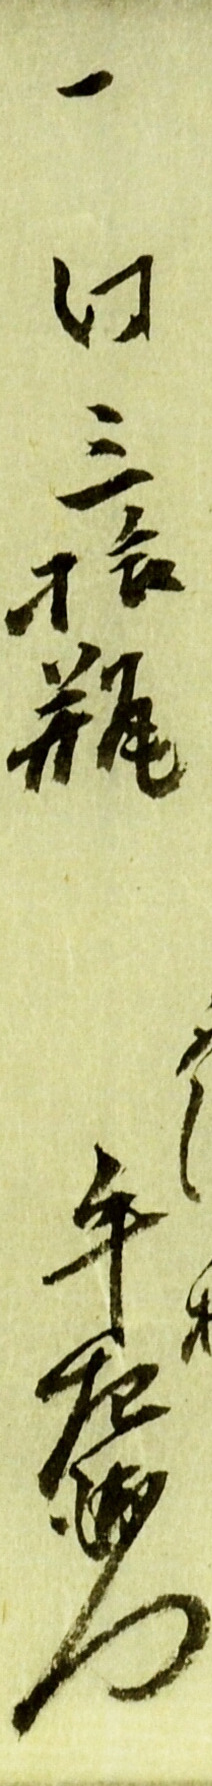一同三拾瓶平左衛門
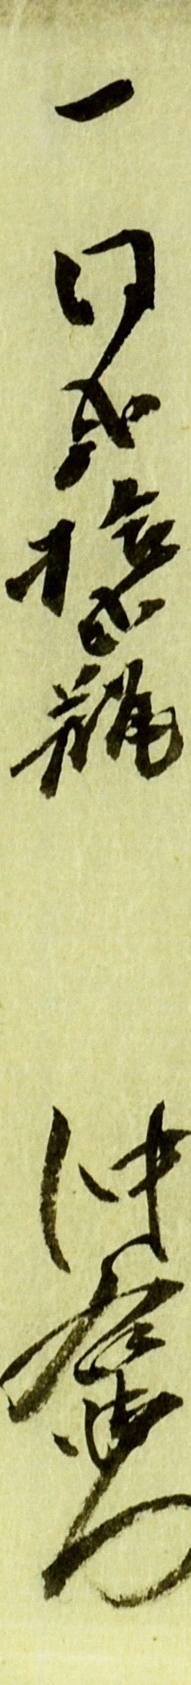一同弐拾弐瓶仲右衛門
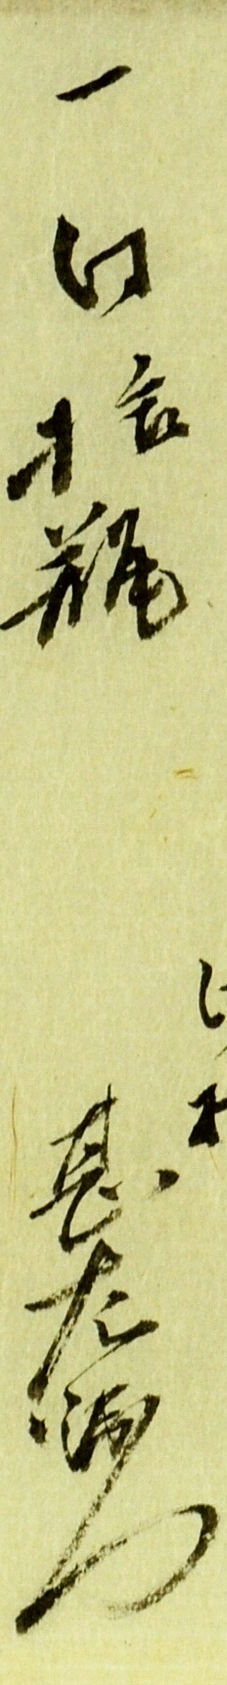一同拾瓶甚左衛門
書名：御領分中御領分中紺屋藍瓶員数御改帳
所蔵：伊那市立高遠町図書館・合同会社AMANE
